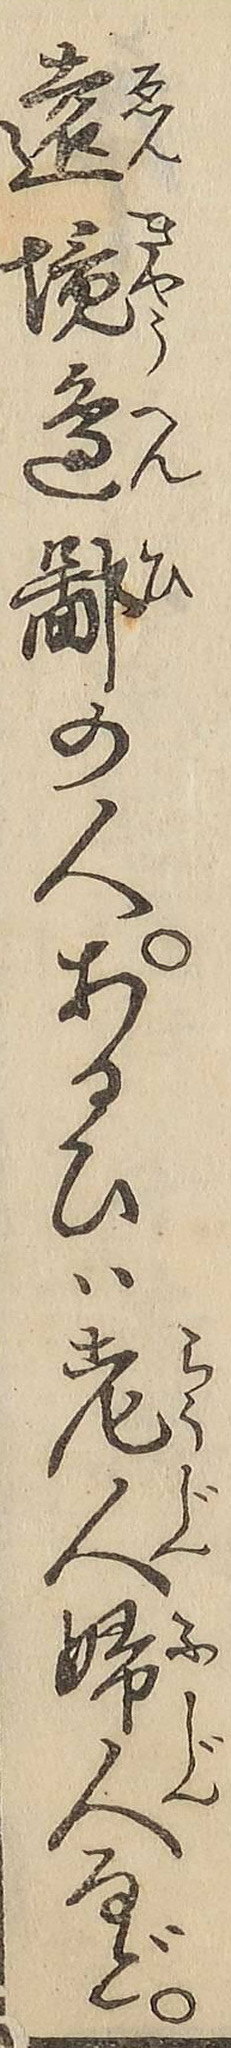遠境辺鄙の人。あるひは老人婦人など。
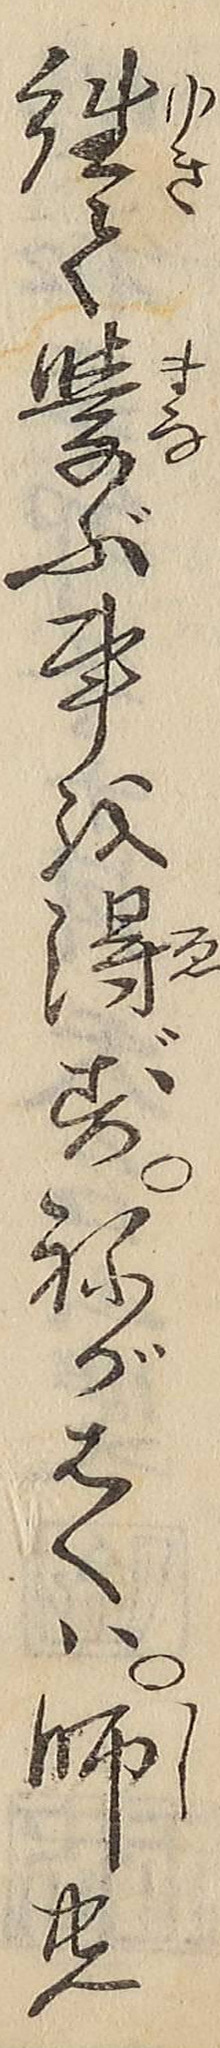往て学ぶ事を得ず。ねがはくは。師の
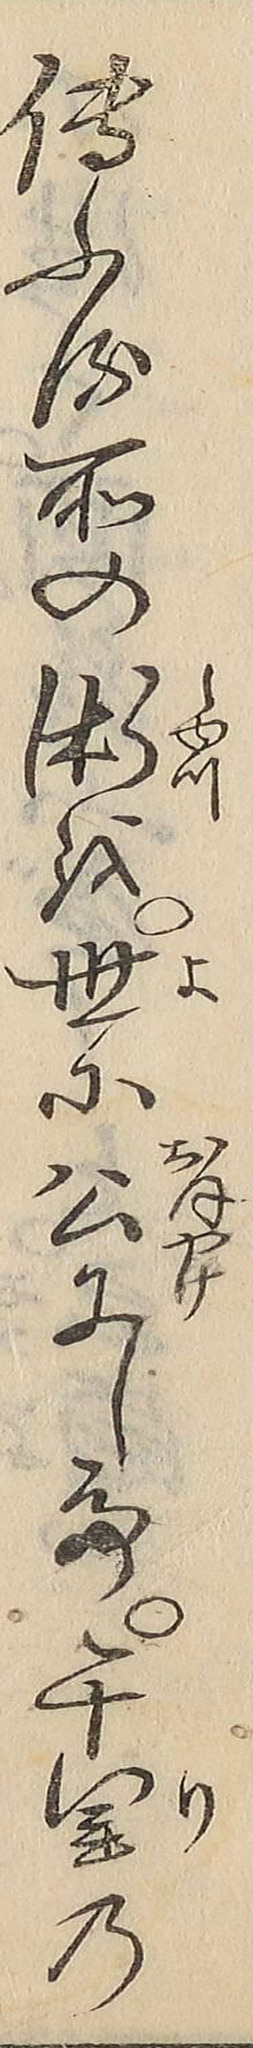伝ふる所の術を。世に公にして。千里の
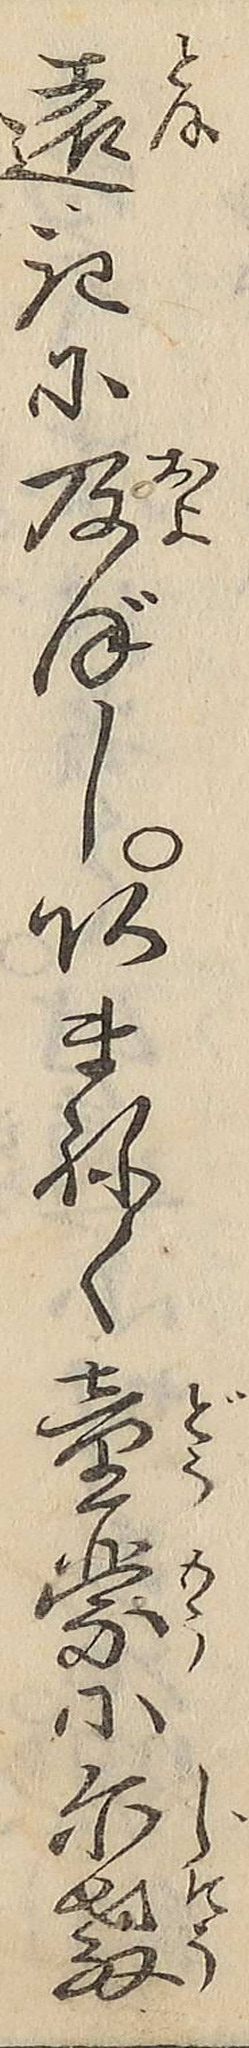遠きに及ぼし。あまねく童蒙に示教
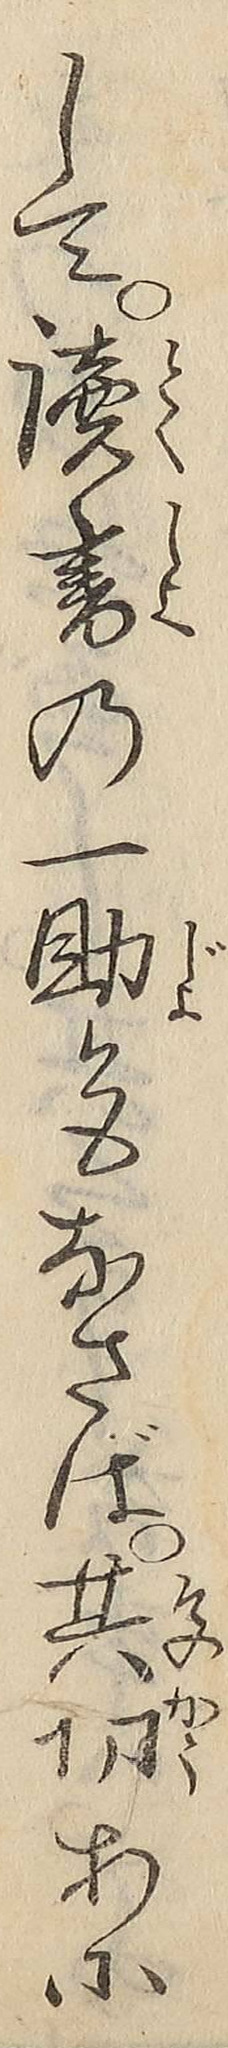して。読書の一助ともなさば。其功あに
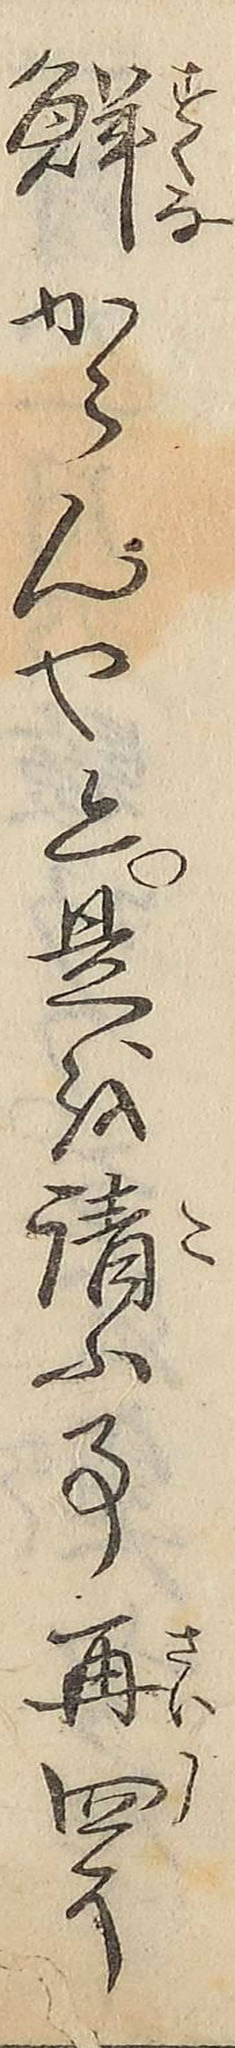鮮からんやと。是を請ふ事再四に
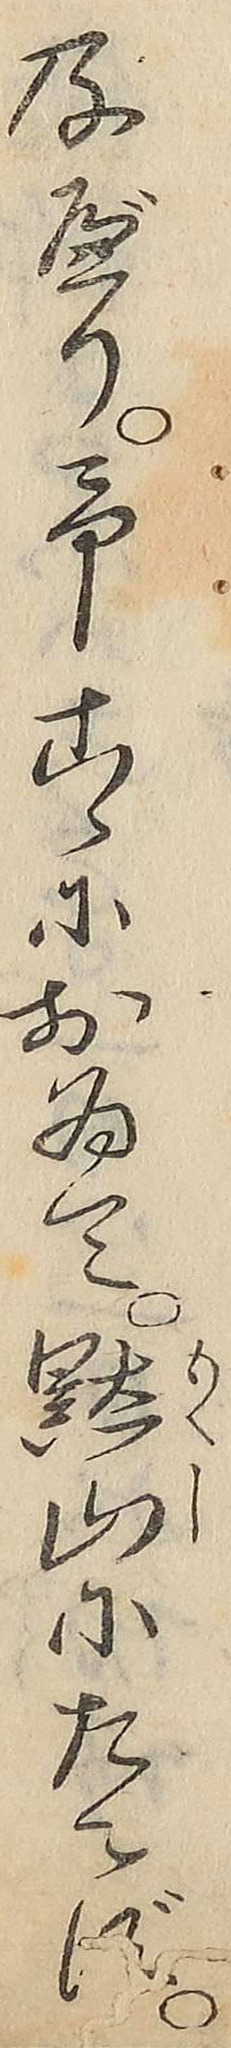及べり。予こゝにおゐて。黙止にたえず。
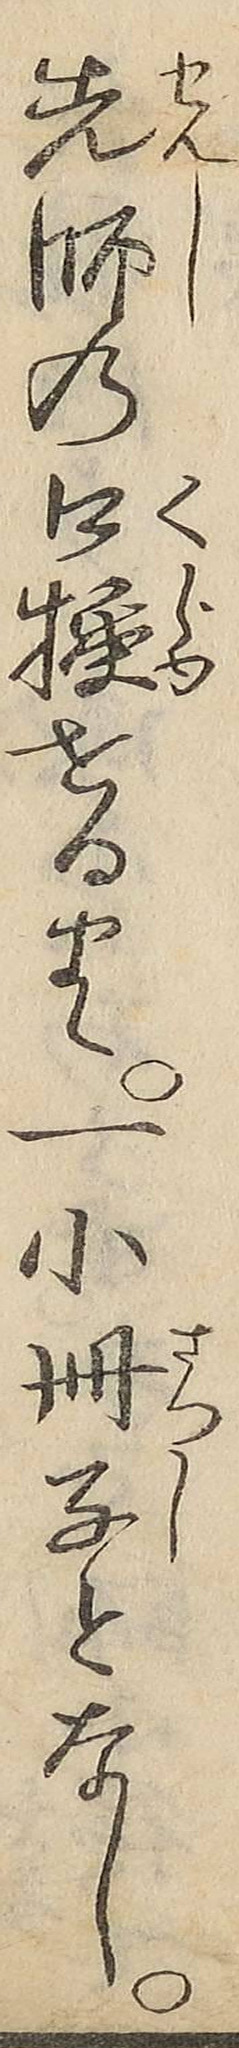先師の口授せるまゝ。一小冊子となし。
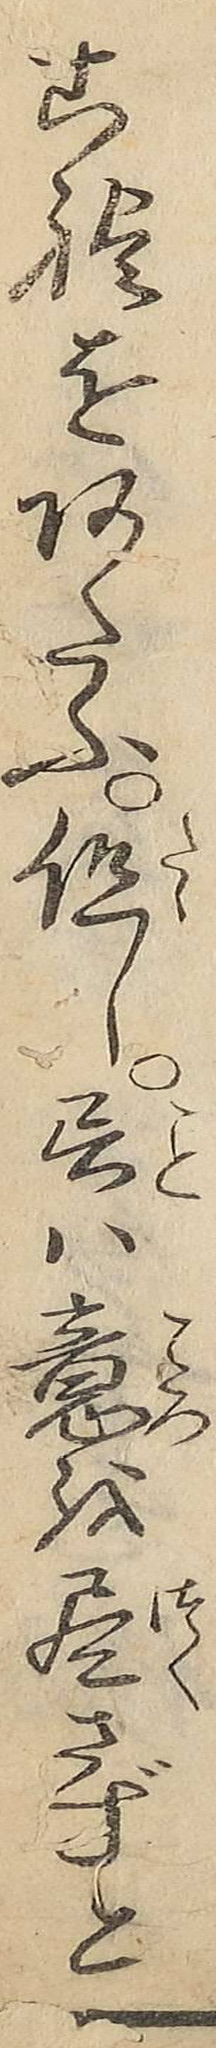これをあたふ。但し。言は意を尽さずと

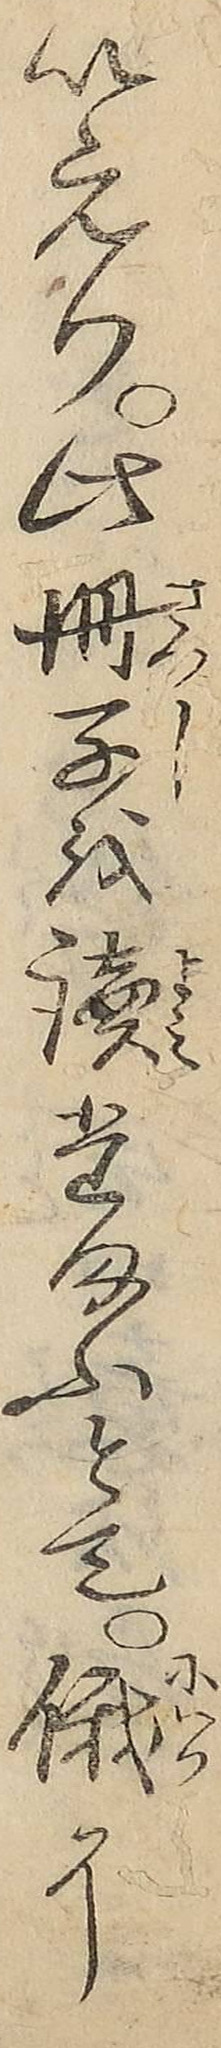いえり。此冊子を読たまふとて。俄に
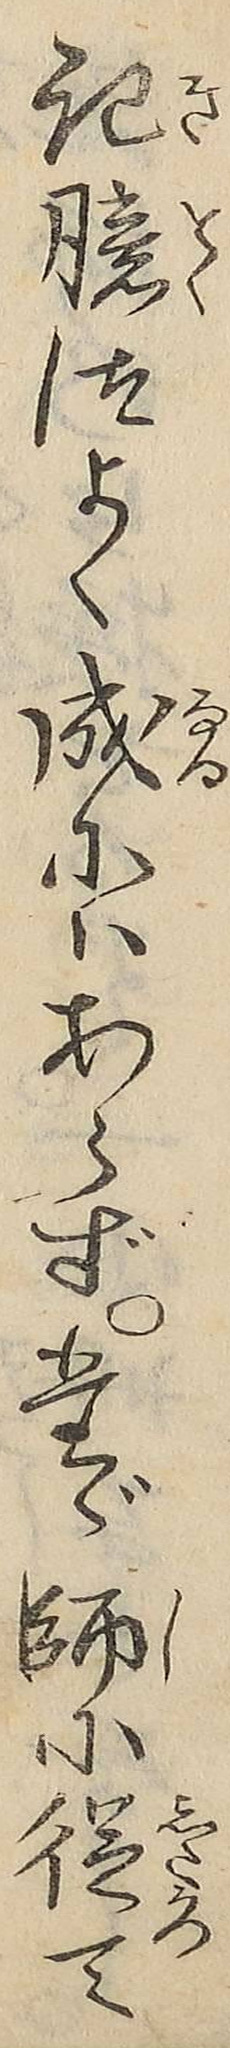記臆つよく成にはあらず。たゞ師に従て
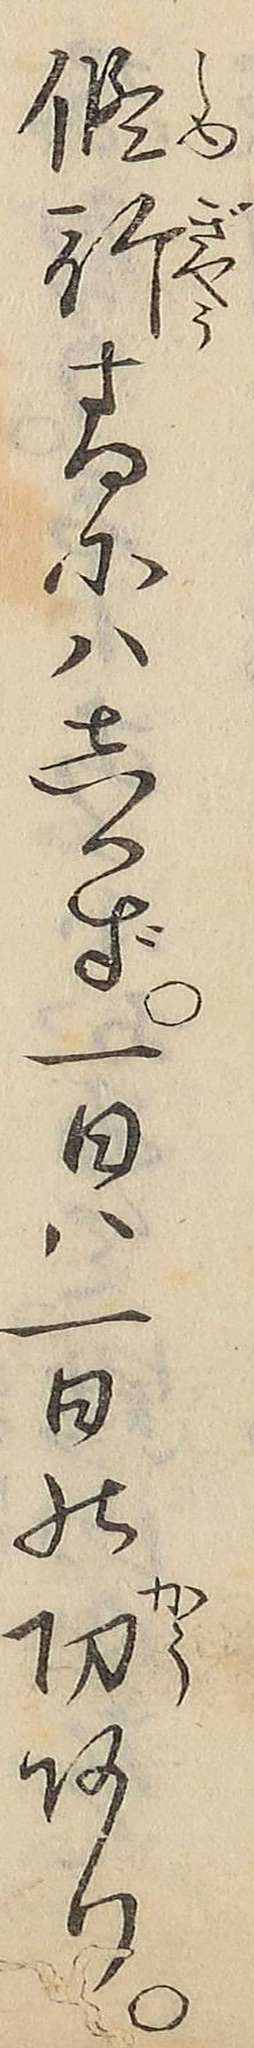修行するにはしかず。一日は一日の功あり。
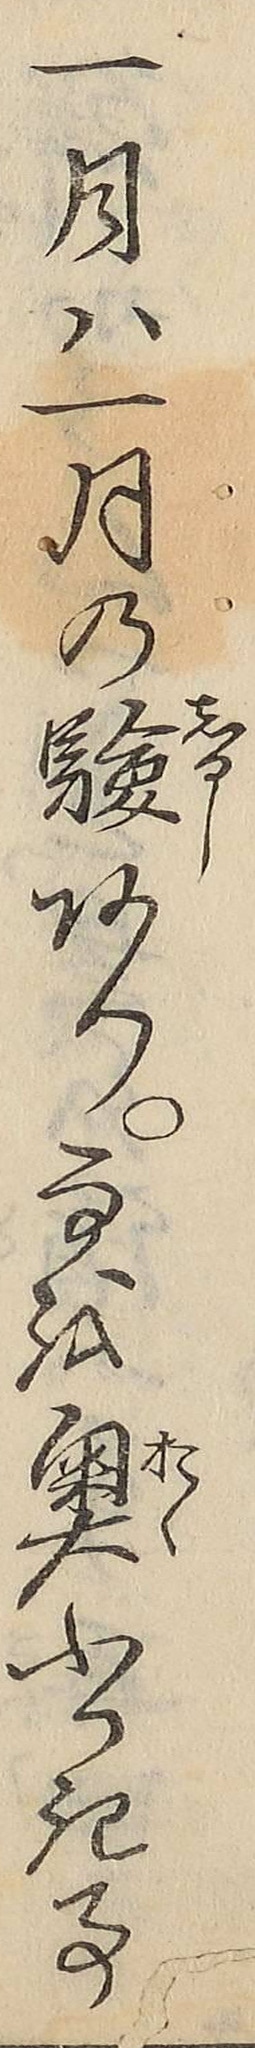一月は一月の験あり。なを奥ふかき事
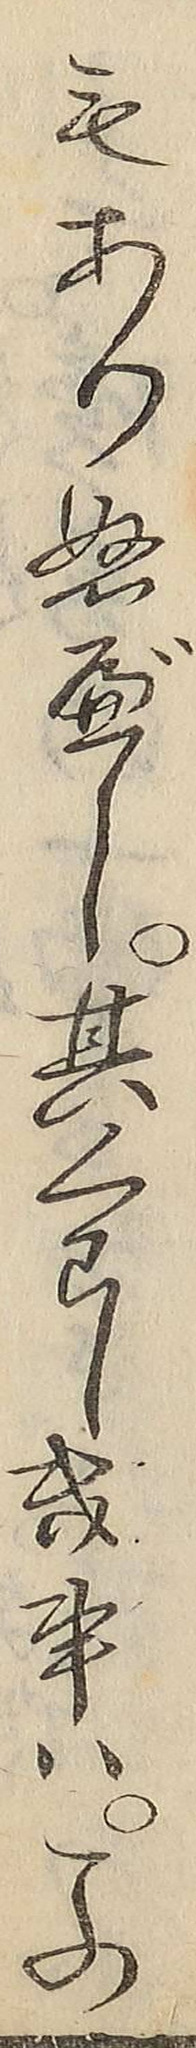もありぬべし。其くわしき事は。この
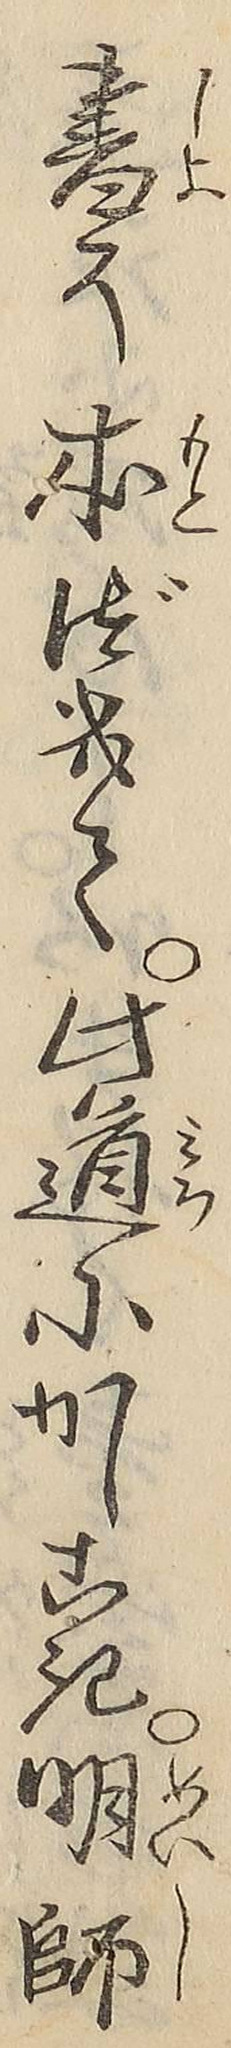書に本づきて。此道にかしこき。明師
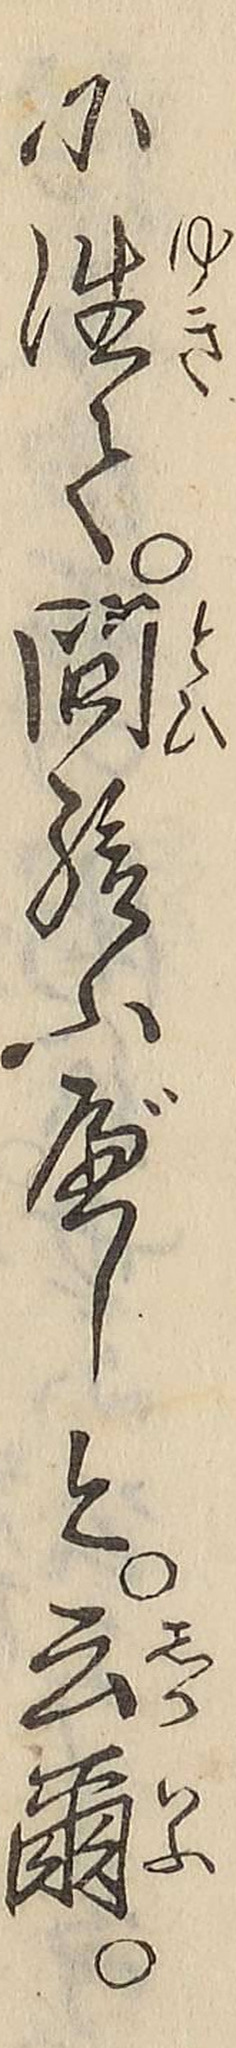に往て。問給ふべしと。云爾。
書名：物覺秘傳
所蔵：神戸大学附属図書館 国文学研究資料館
